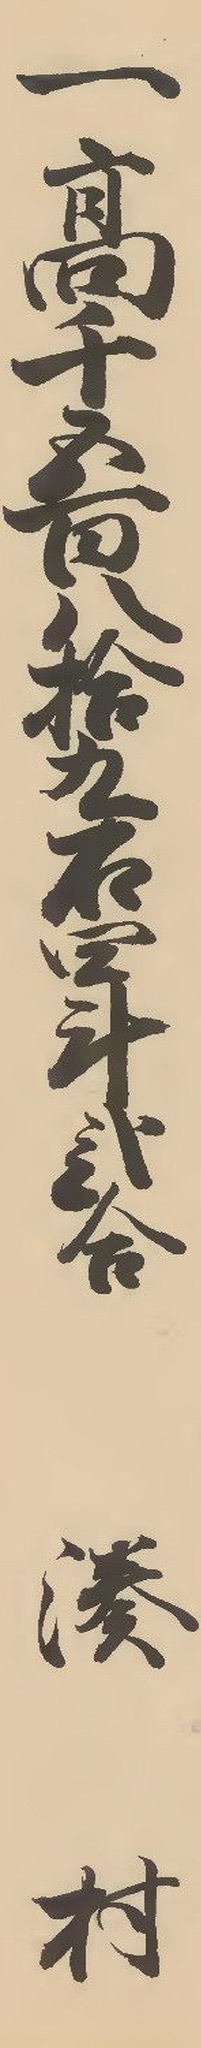一髙千五百八拾九石四斗弐合湊村
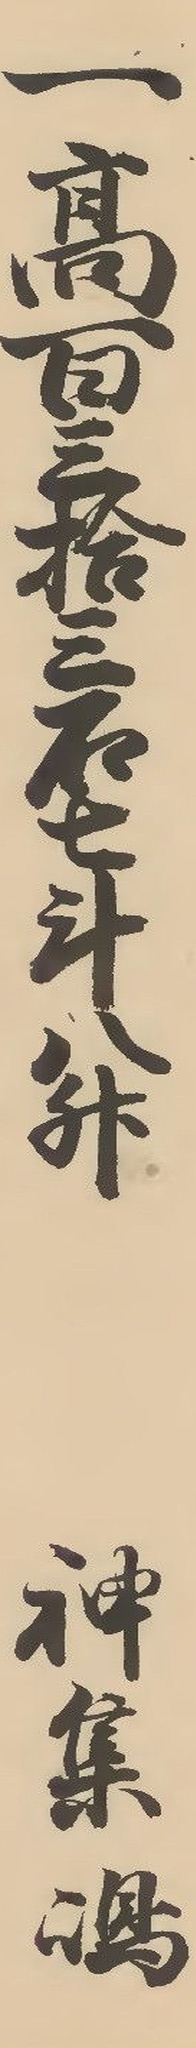一髙百三拾三石七斗八升神集嶋
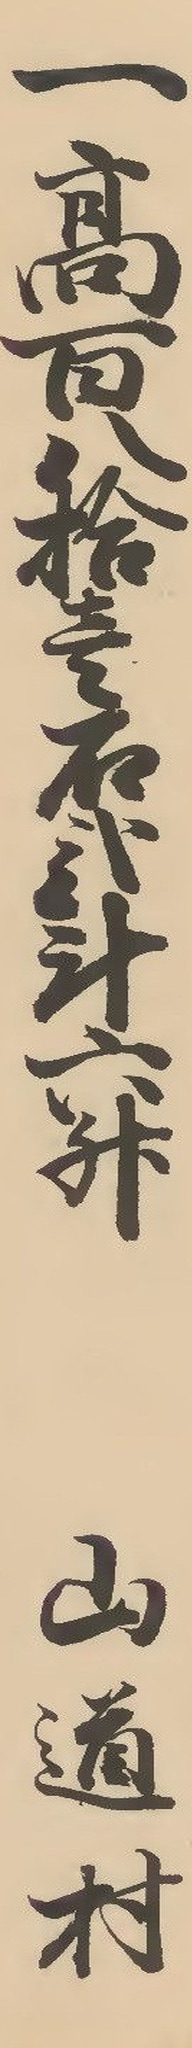一髙百八拾壱石弐斗六升山道村

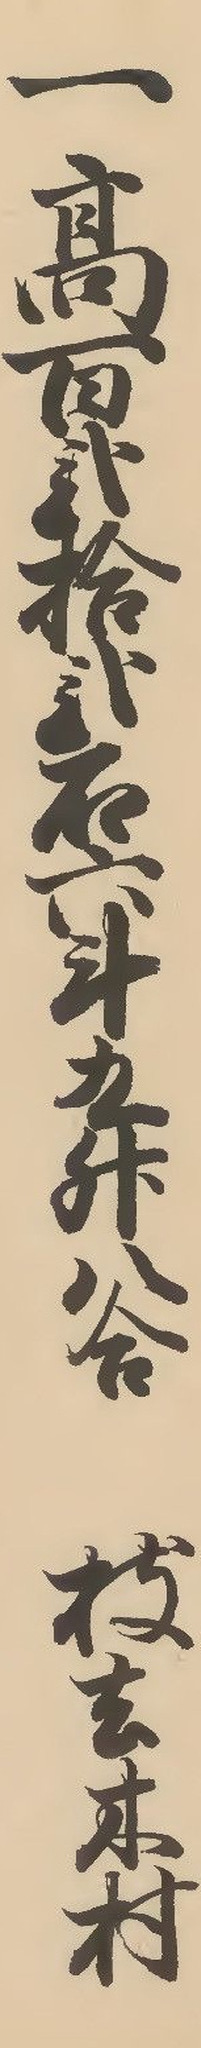一髙百弐拾弐石六斗九升八合枝玄木村
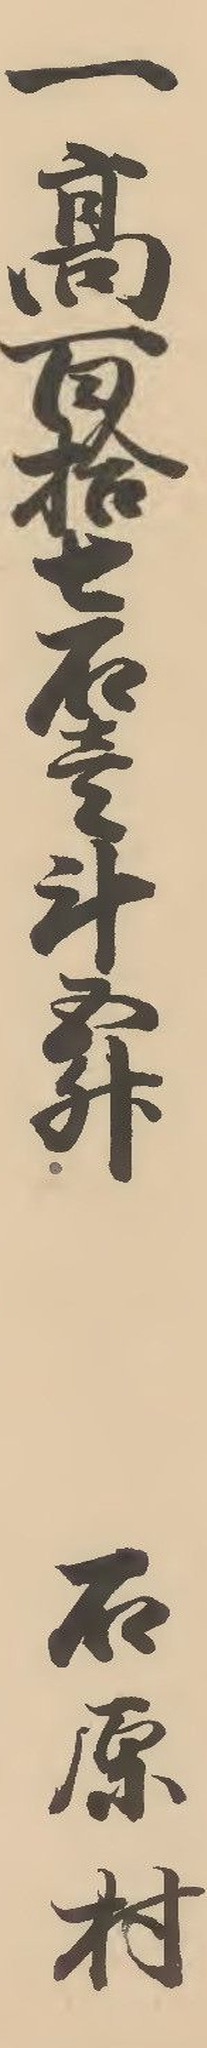一髙百拾七石壱斗五升石原村
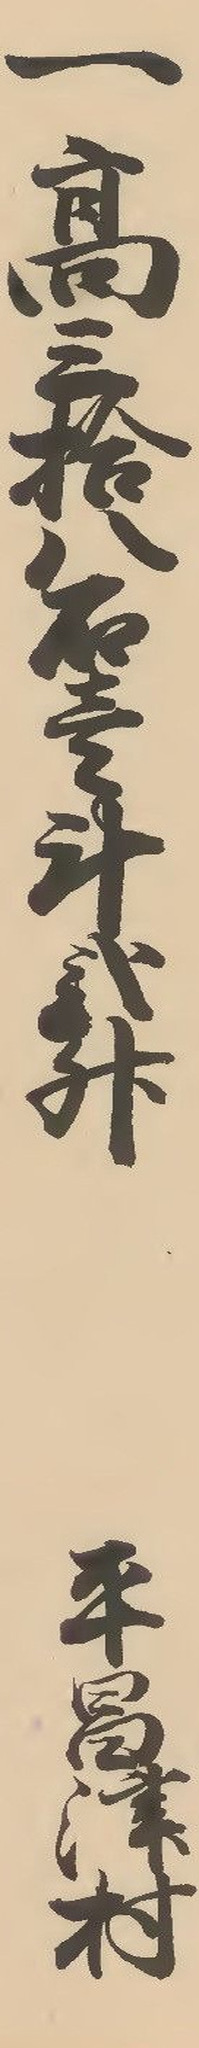一髙三拾八石壱斗弐升平昌津村
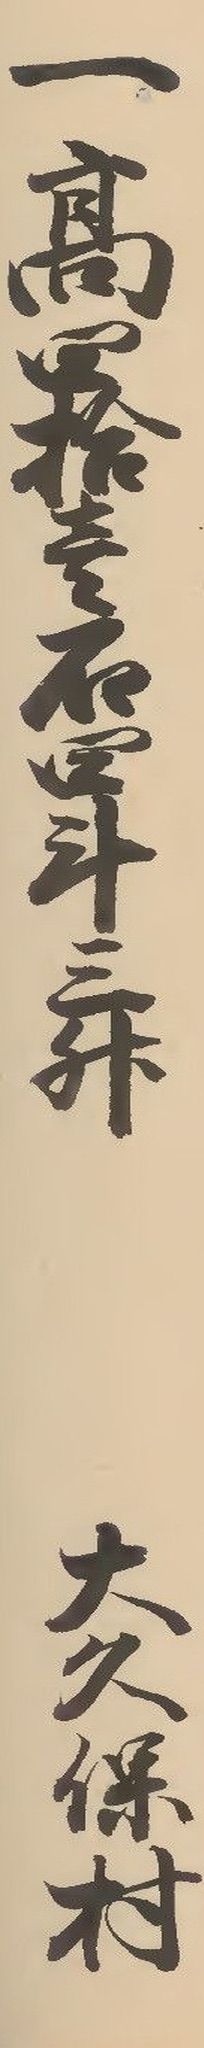一髙四拾壱石四斗三升大久保村
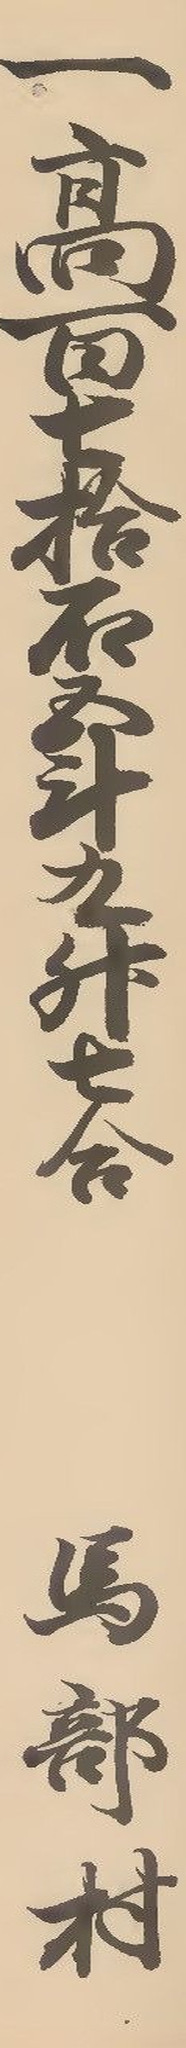一髙百七拾石五斗九升七合馬部村
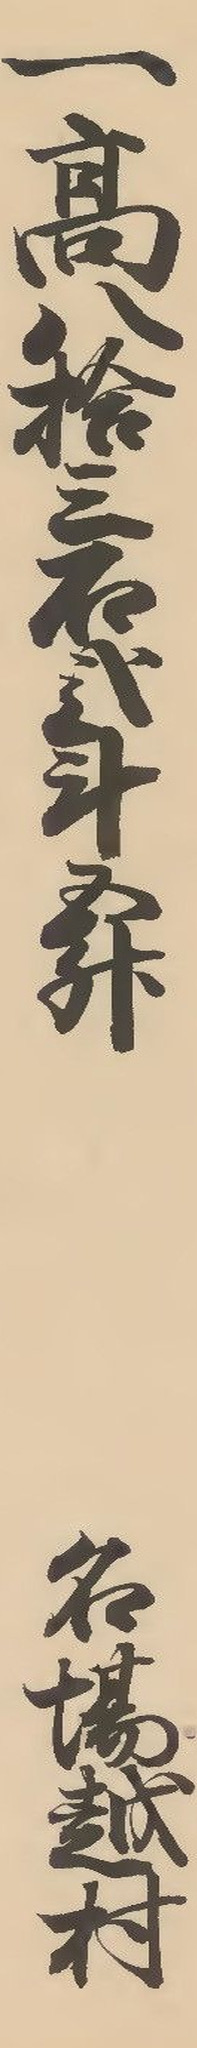一髙八拾三石弐斗五升名場越村
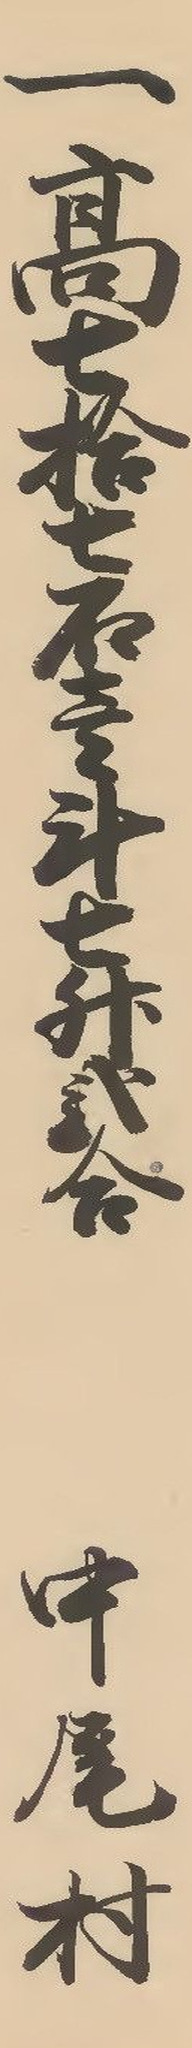一髙七拾七石壱斗七升弐合中尾村
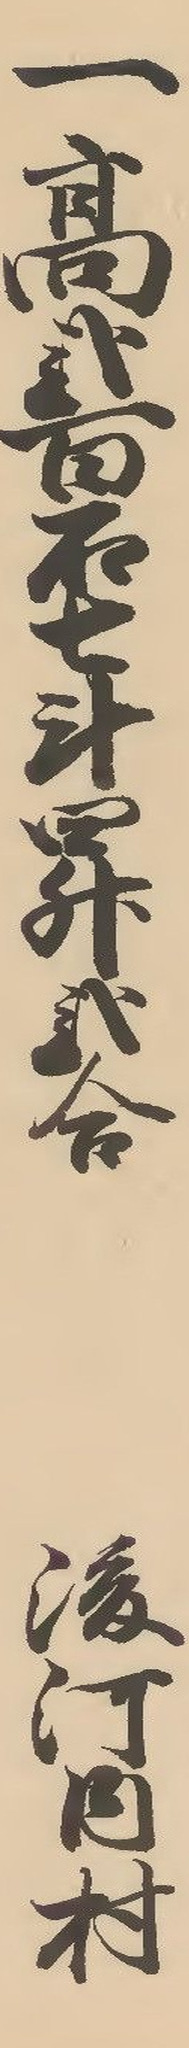一髙弐百石七斗四升弐合後河内村

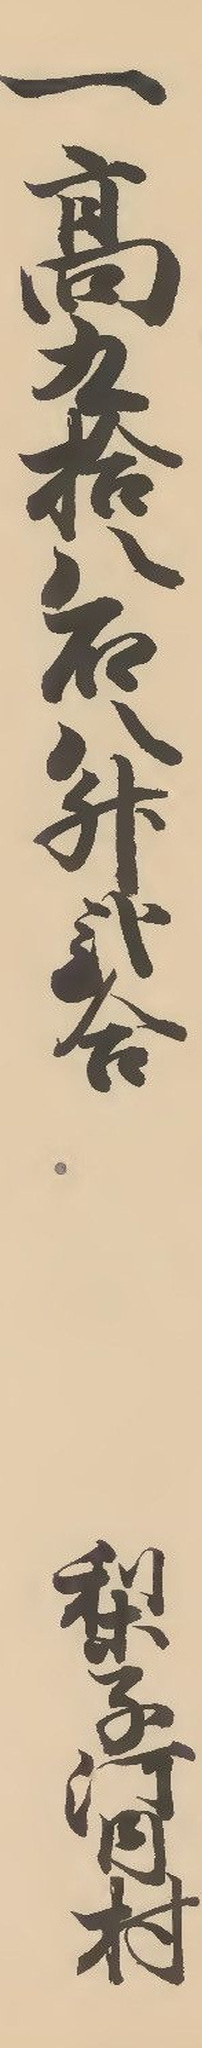一髙九拾八石八升弐合梨子河内村
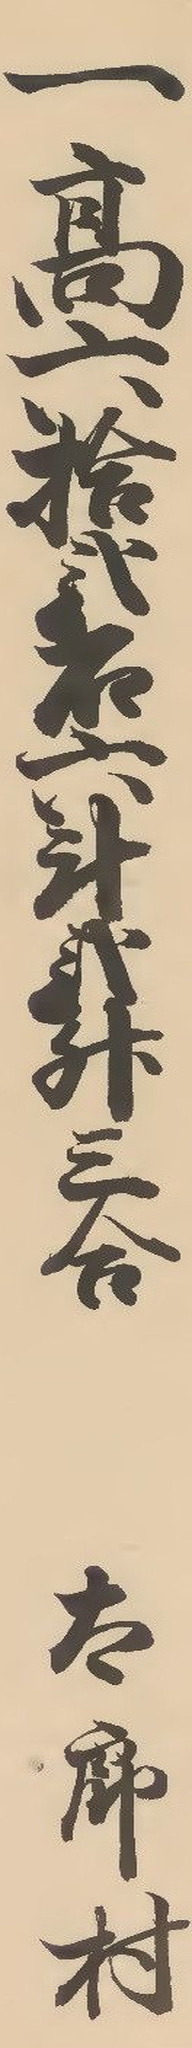一髙六拾弐石六斗弐升三合太郎村
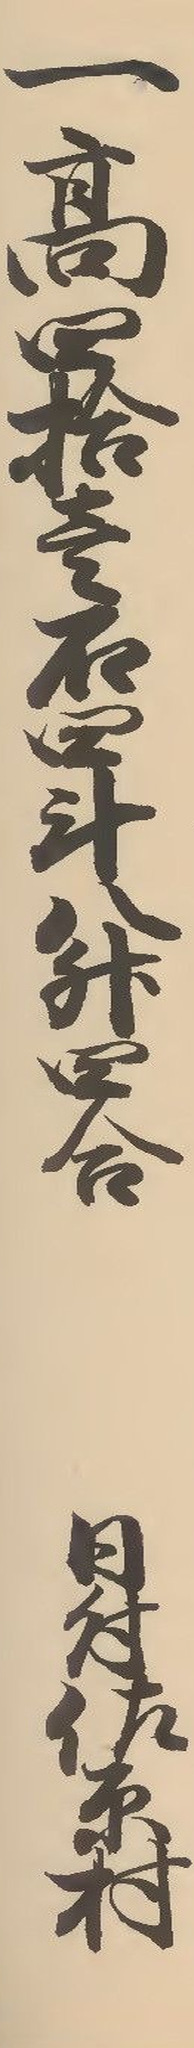一髙四拾壱石四斗八升四合目付佐原村
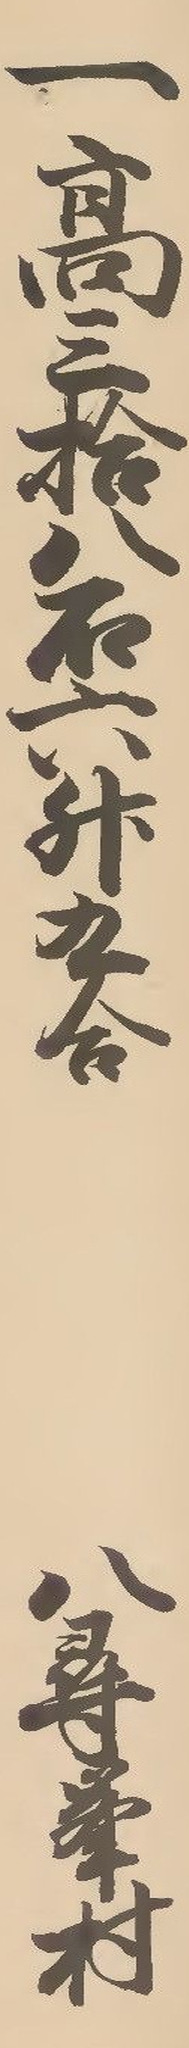一髙三拾八石六升九合八尋峯村
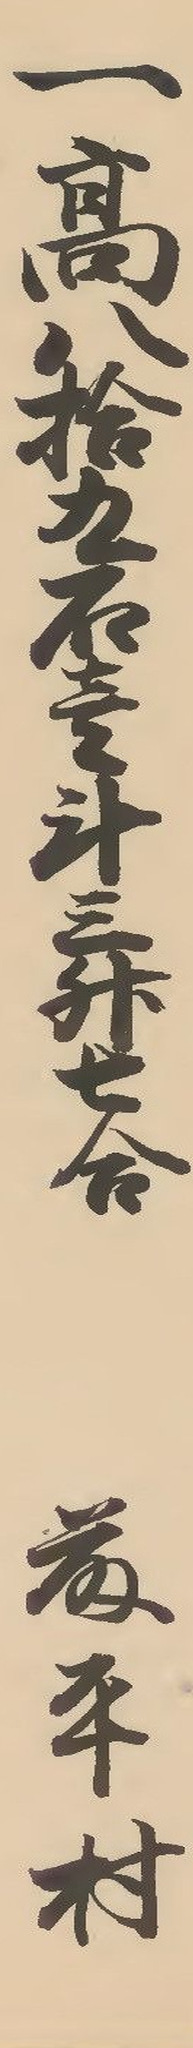一髙八拾九石壱斗三升七合藤平村
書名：肥前国郷帳
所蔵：国立公文書館 National Archives of Japan
